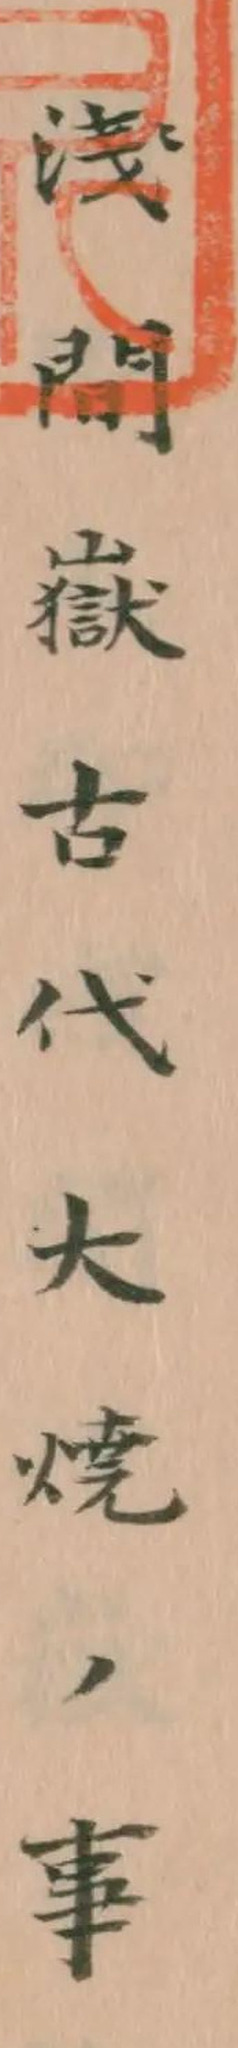浅間嶽古代大焼ノ事
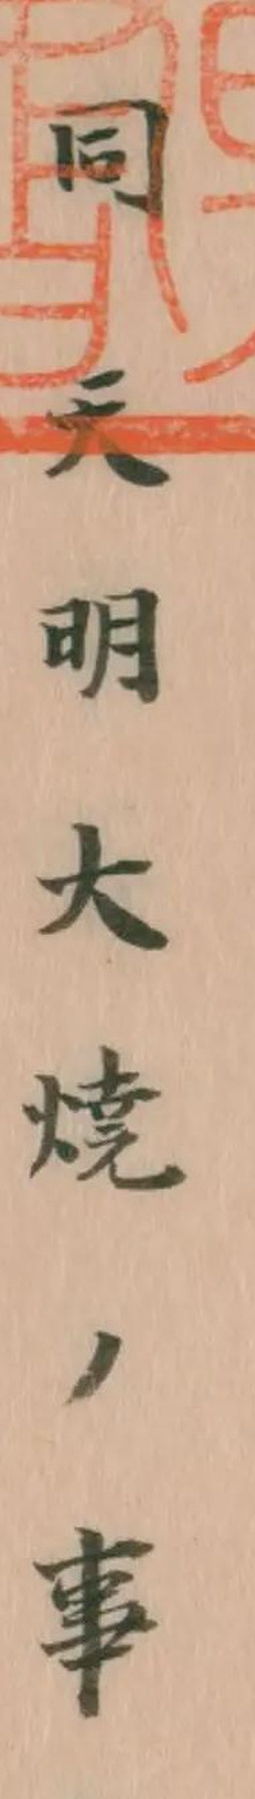同天明大焼ノ事
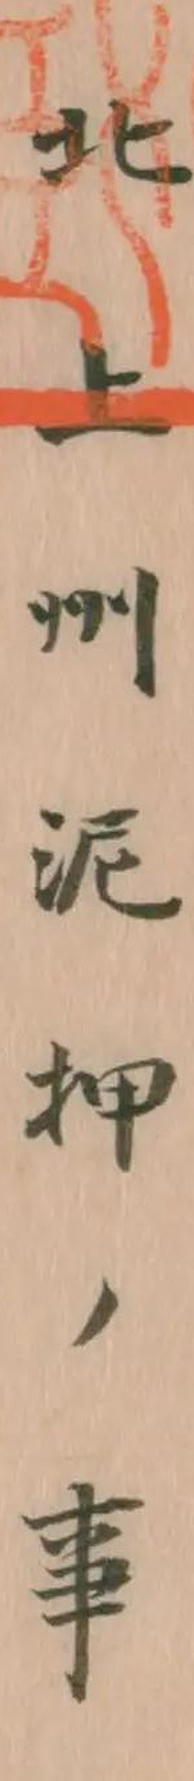北上州泥押ノ事
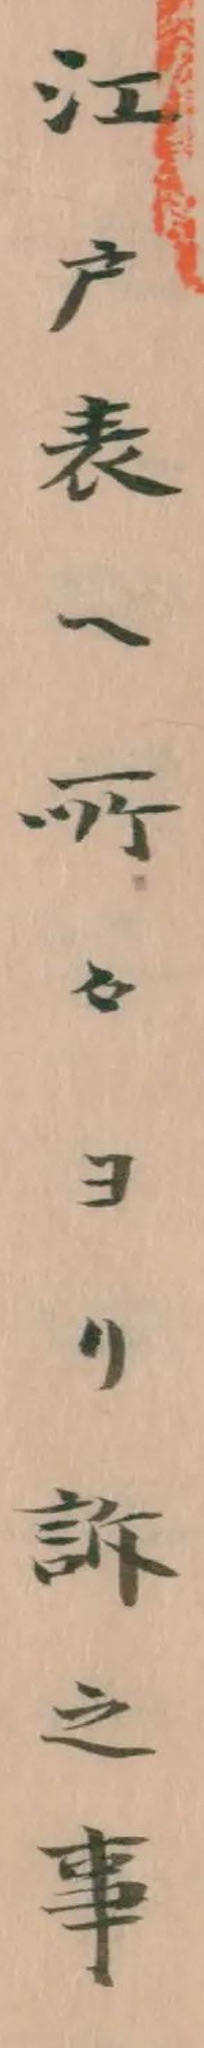江戸表へ所々ヨリ訴之事
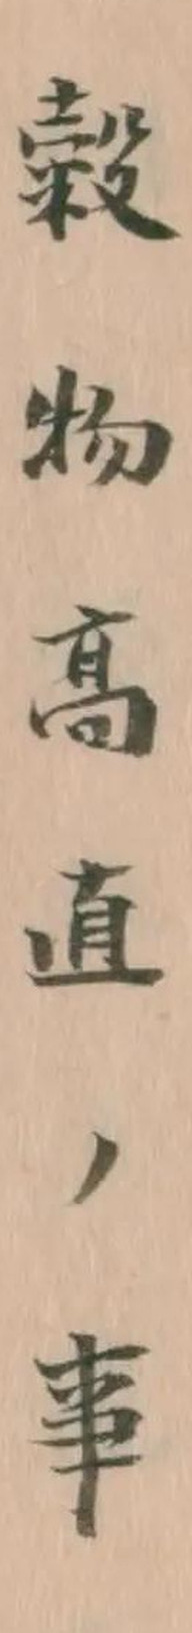穀物高直ノ事
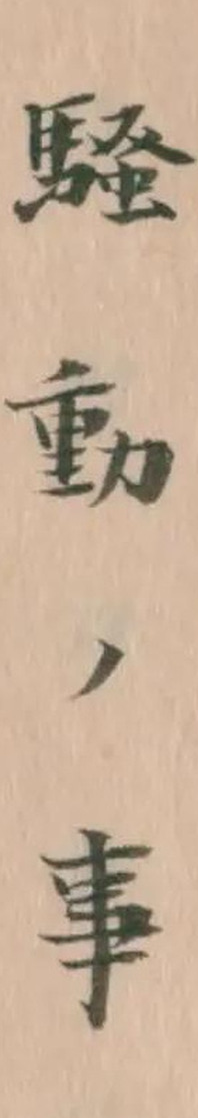騒動ノ事
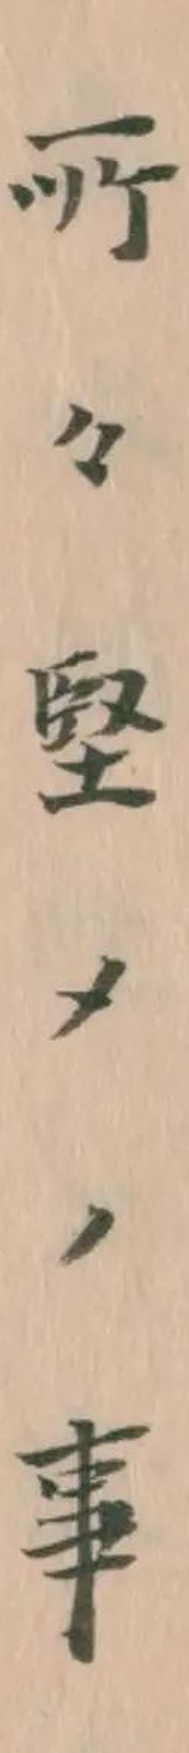所々堅メノ事
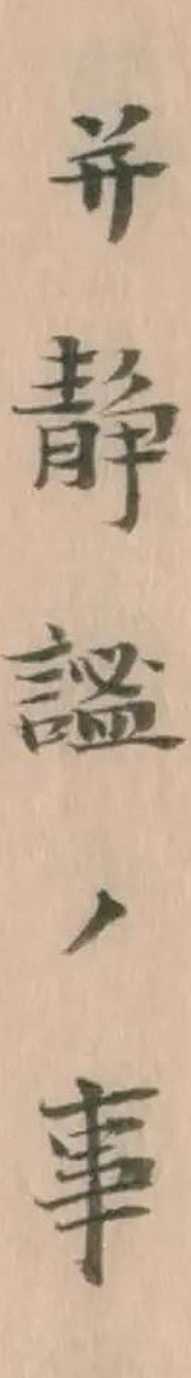并静謐ノ事
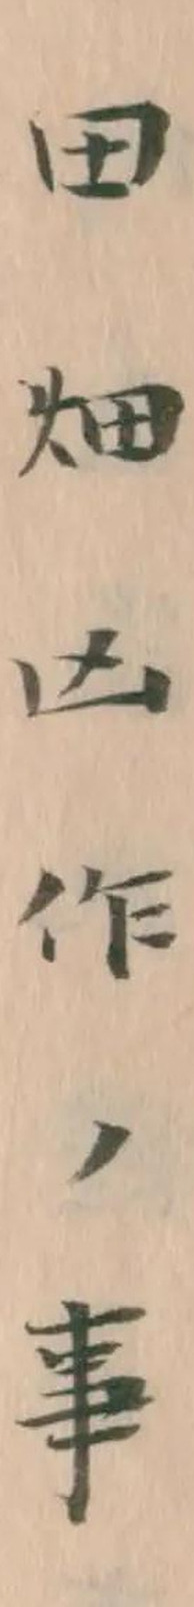田畑凶作ノ事

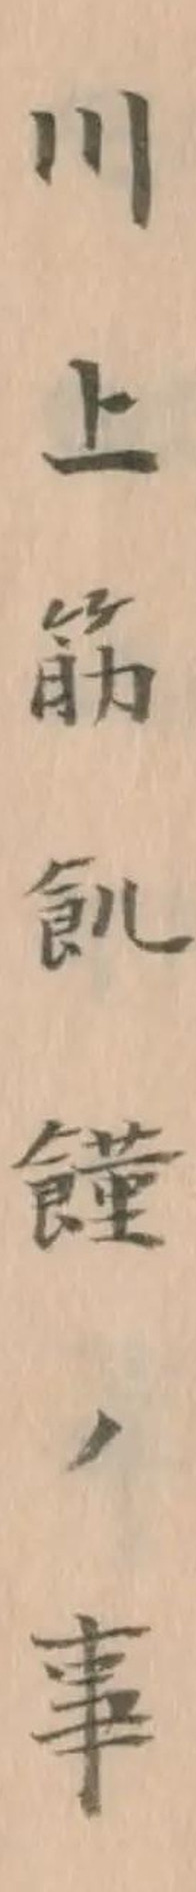川上筋飢饉ノ事
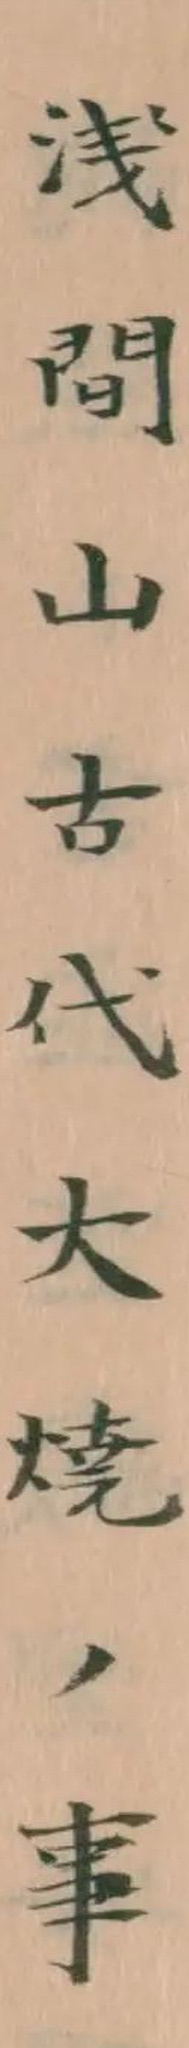浅間山古代大焼ノ事
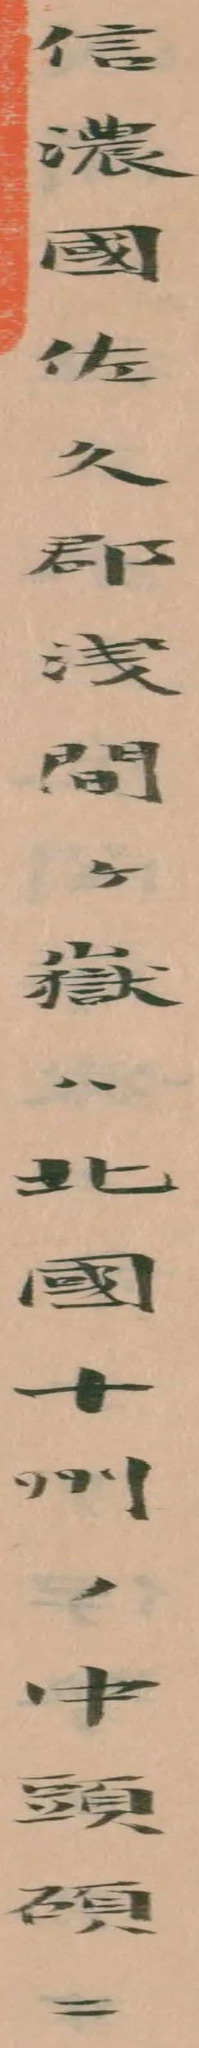信濃国佐久郡浅間ヶ嶽ハ北国十州ノ中頭碩二
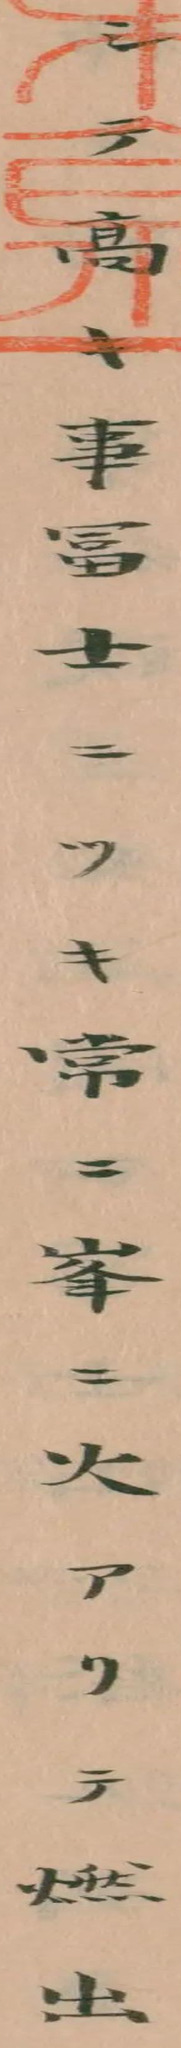シテ高キ事富士二ツキ常二峯二火アリテ燃出
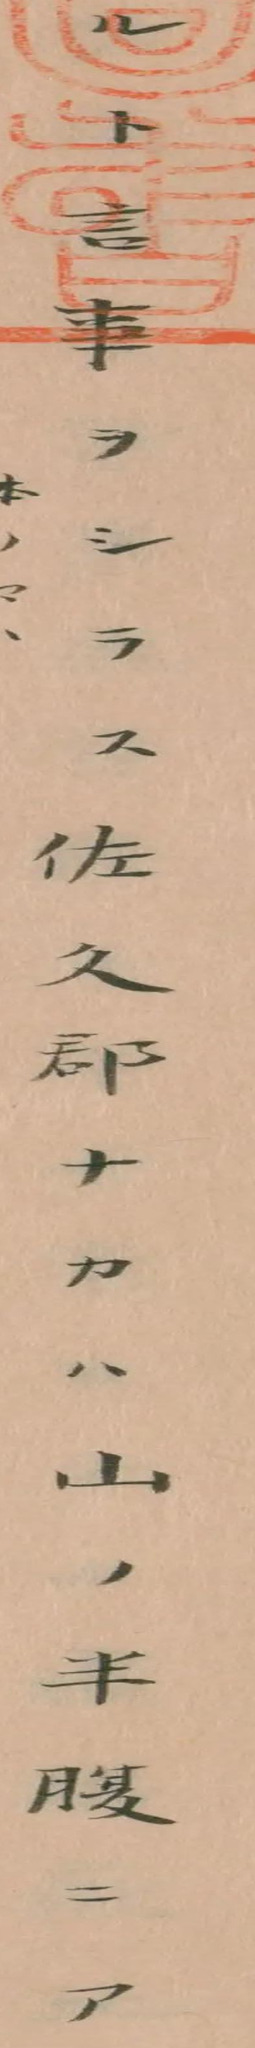ルト言事ヲシラス佐久郡ナカハ山ノ半腹二ア
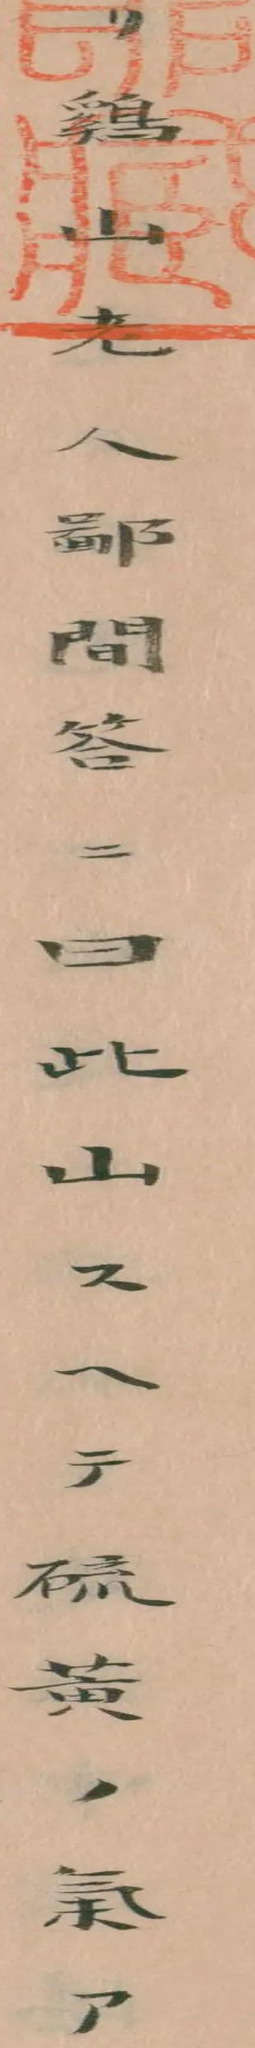り鶏山老人鄙問答二曰此山スへテ硫黄ノ気ア
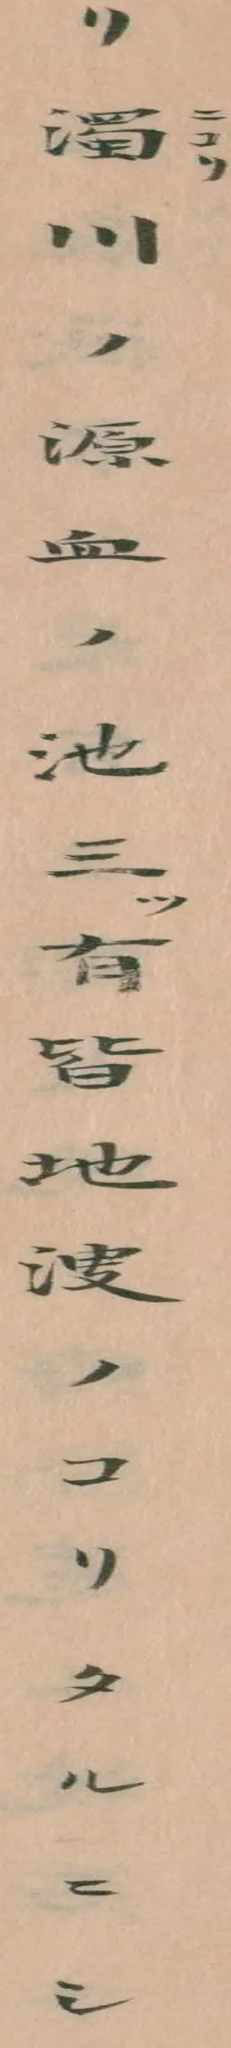リ濁川ノ源血ノ池三ッ有皆地溲ノコリタル二シ
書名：地災撮要. 巻3(地震之部)-巻4(噴火之部)
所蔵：国立国会図書館 National Diet Library, JAPAN
